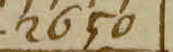2650
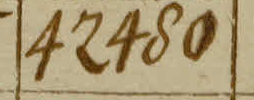42480
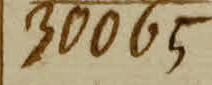30065
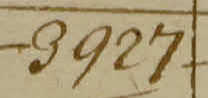3927
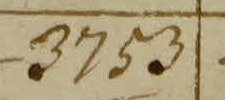3753
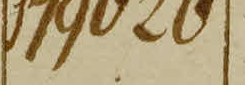179626
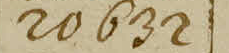20632
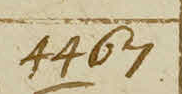4467
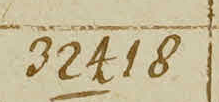32418
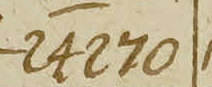24270
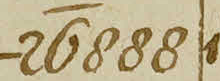26888
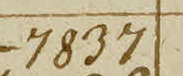7837
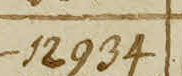12934
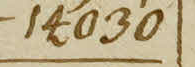14030
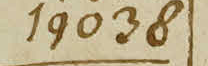19038
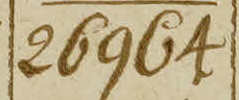26964
